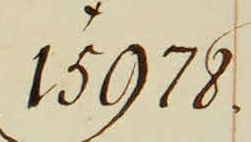15978
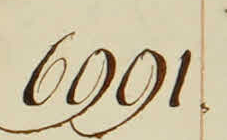6991
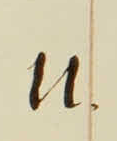11
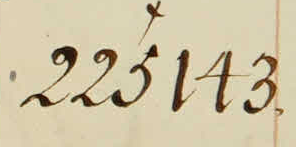225143
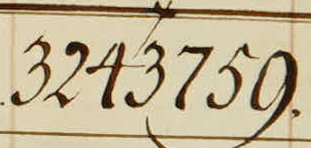3243759
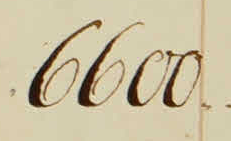6600
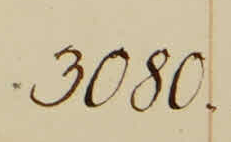3080
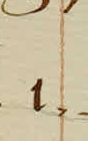1
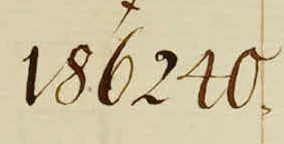186240
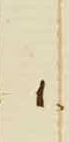1
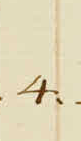4
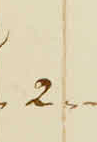2
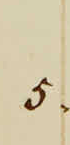5
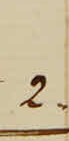2
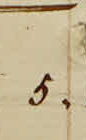5
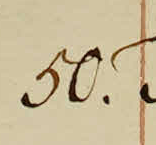50.
